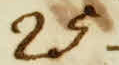25
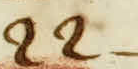22
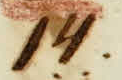14
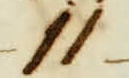11
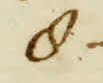8
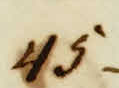45
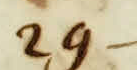29
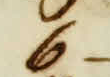6
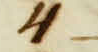4
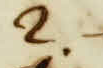2.
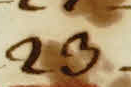23
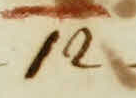12
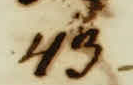43
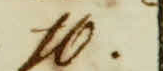10.
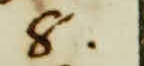8.
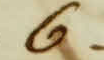6
